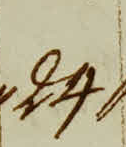24
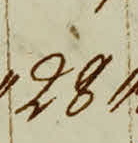28
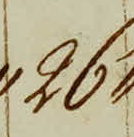26
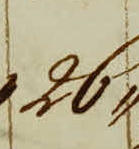26
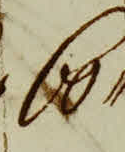60
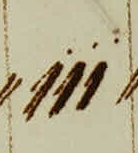111
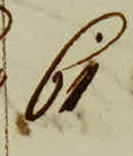61
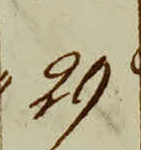29
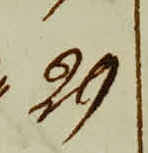29
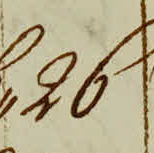26
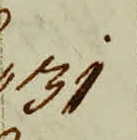31
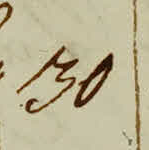30
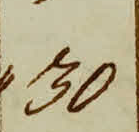30
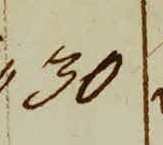30
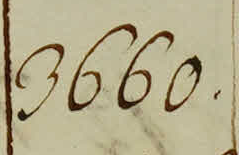3660
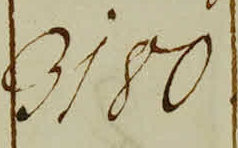3180
